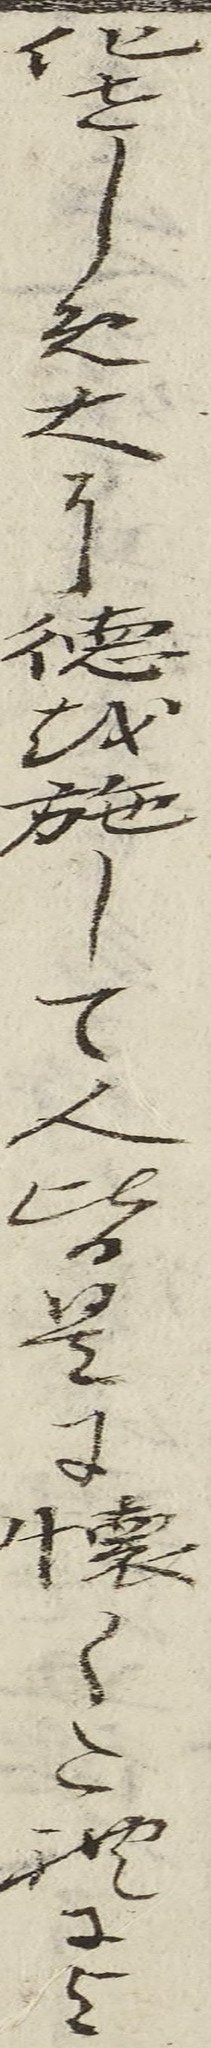化せしめ大に徳を施して人皆是に懐くこれによ

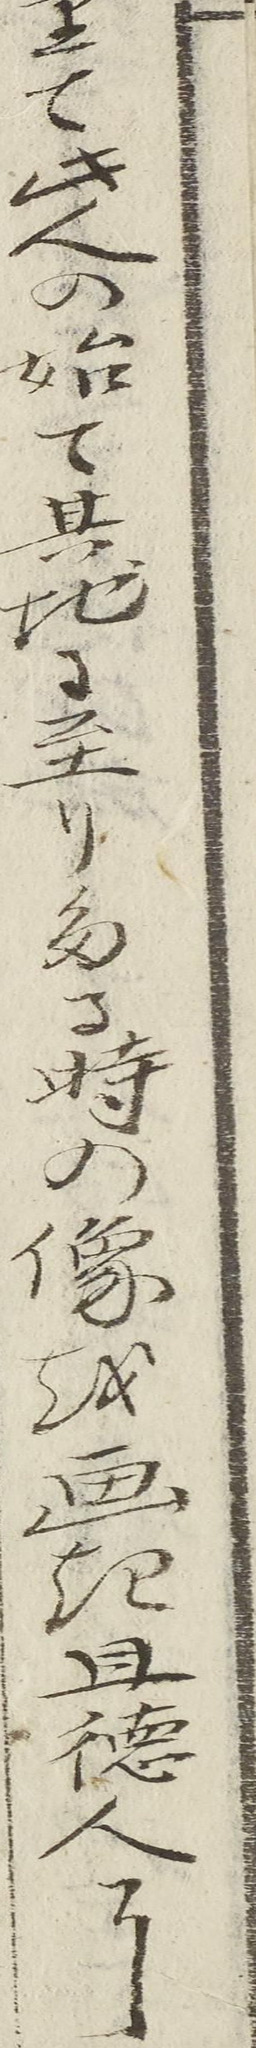りて此人の始て其地に至りたる時の像を画き且徳人に
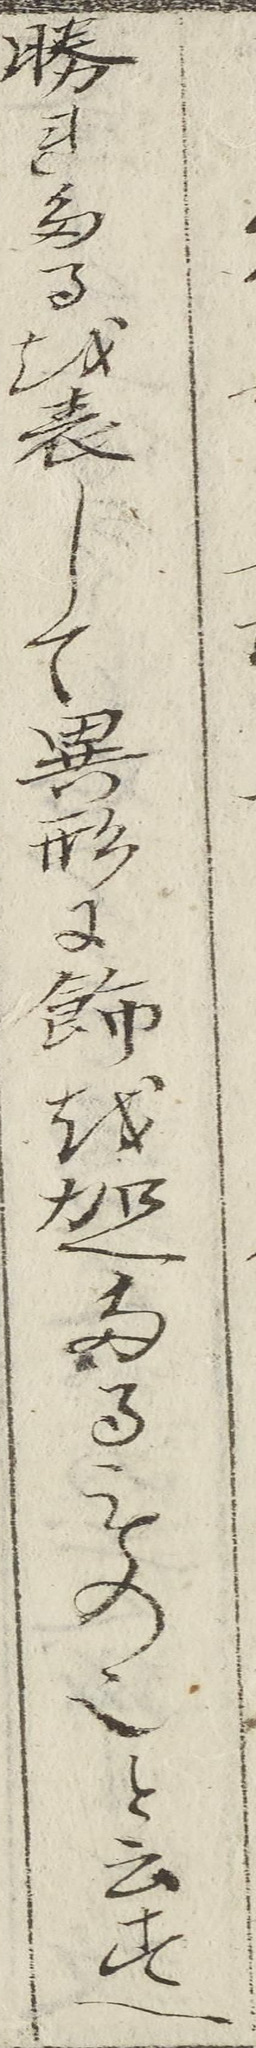勝れたるを表して異形に飾を加へたるもの也と云そへ
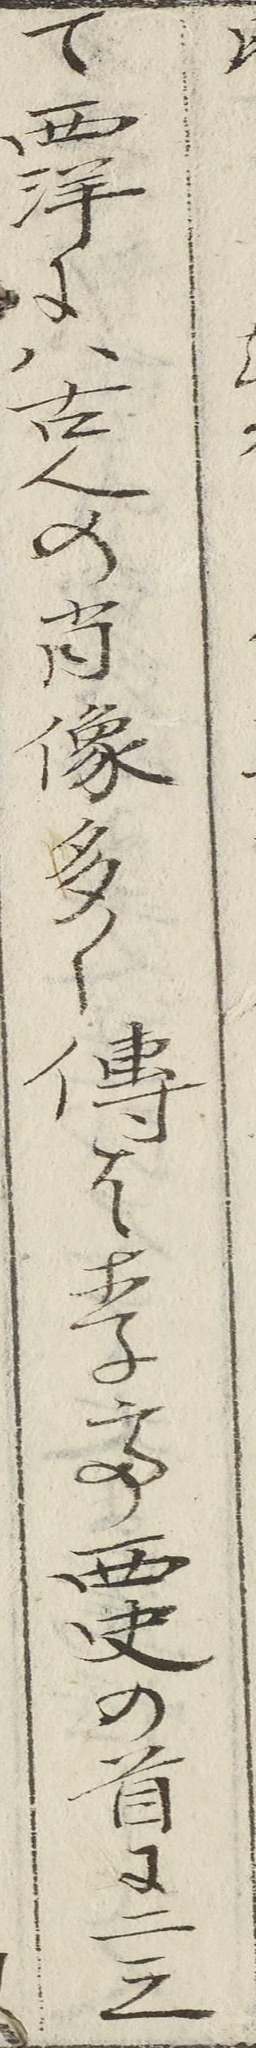て西洋にハ古人の肖像多く伝はりて西史の首に二三
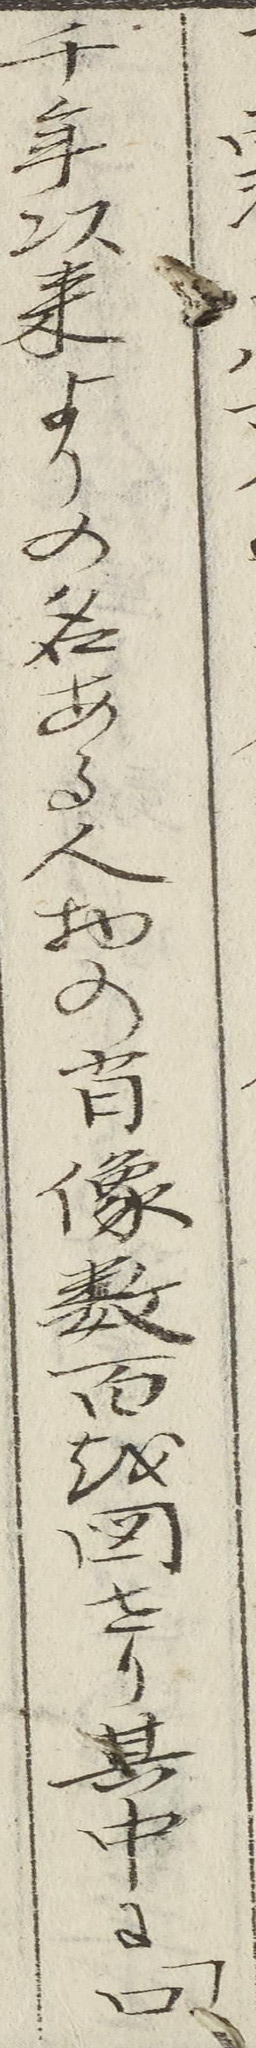千年以来よりの名ある人物も肖像数百を図せり其中に「ロ
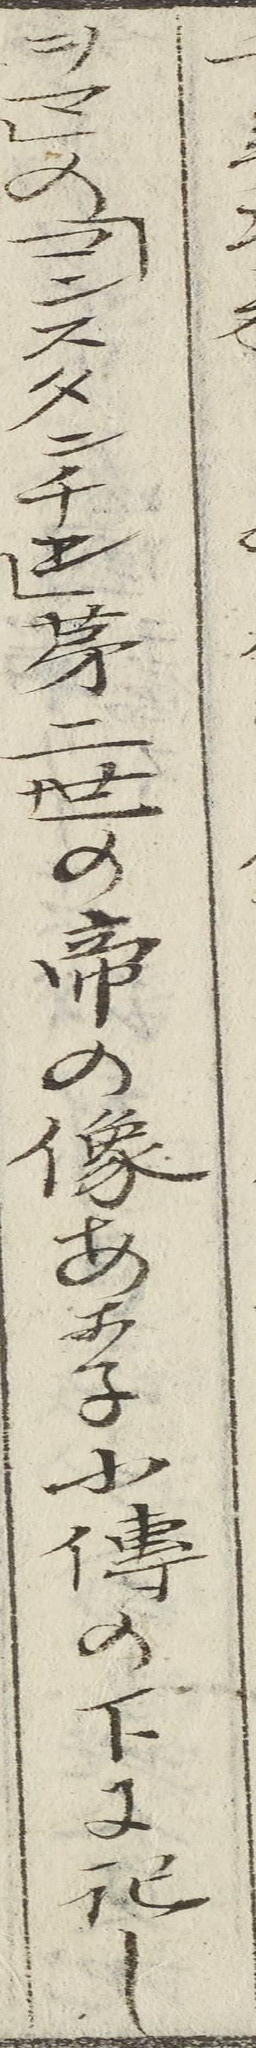ヲマ」の「コンスタンチン」第二世の帝の像あり小伝の下に記し
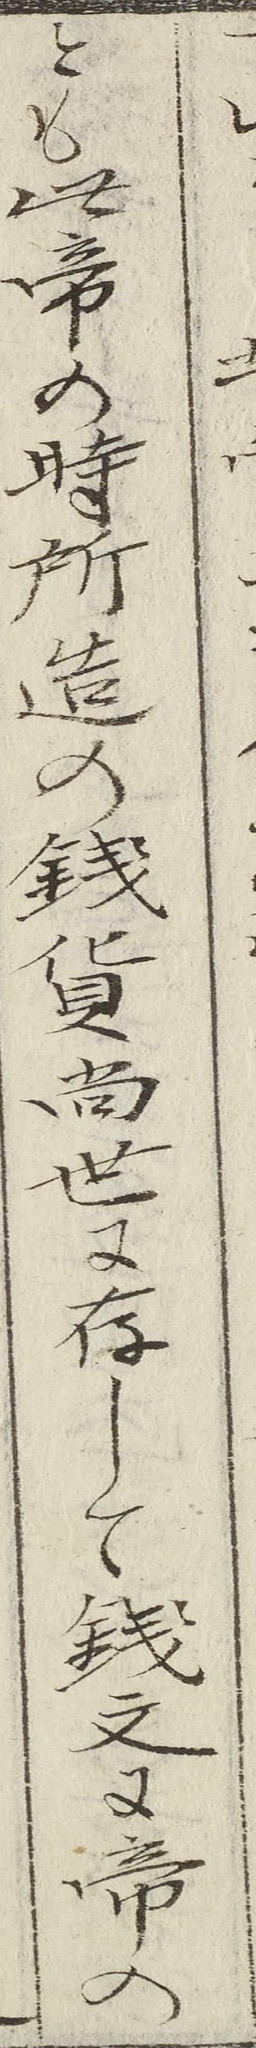ていはく此帝の時所造の銭貨尚世に存して銭文に帝の
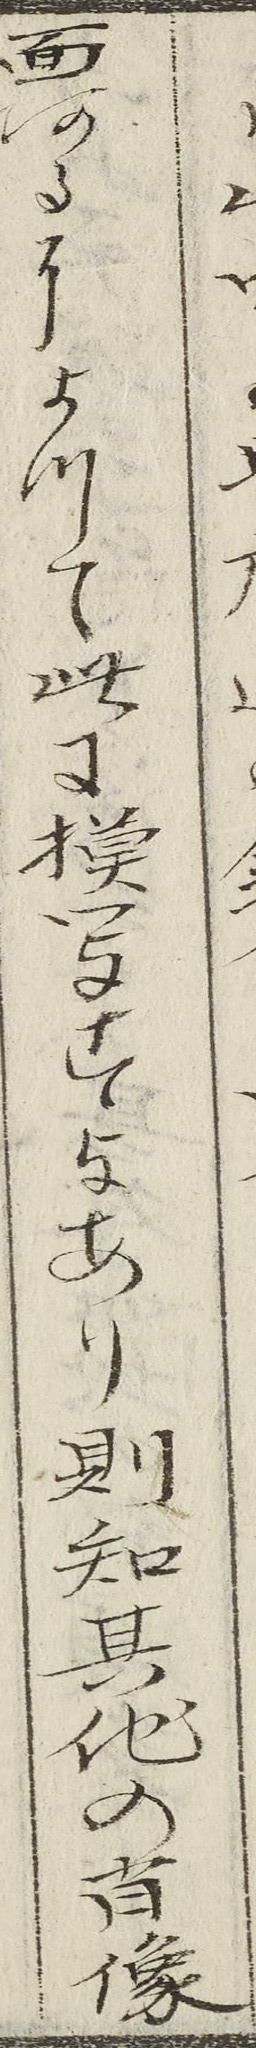面あるによつて此に模写すとあり則知其他の肖像
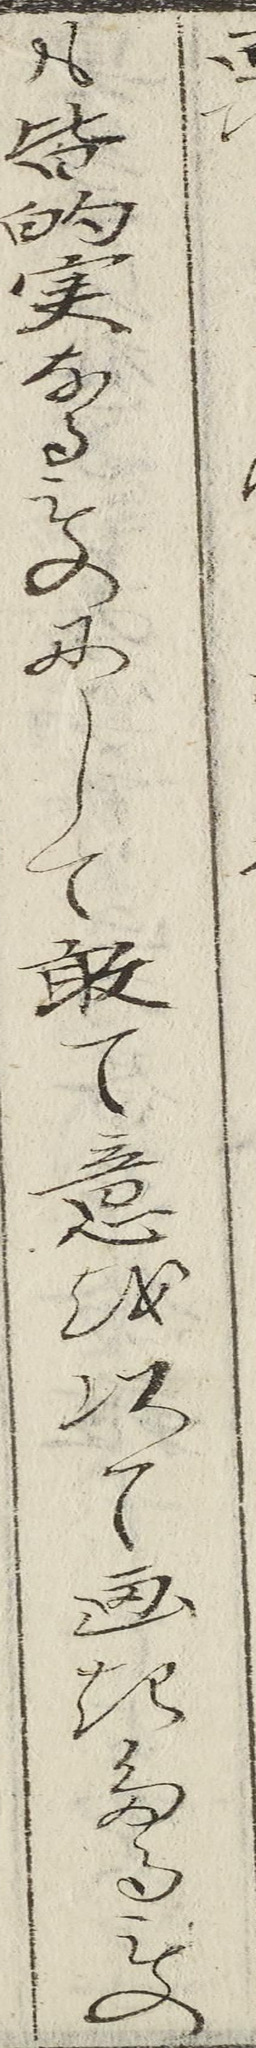も皆的実なるものにして敢て意を以て画きたるもの
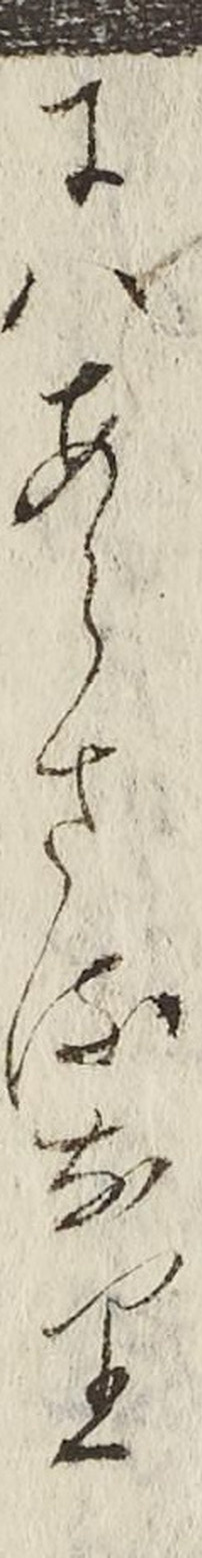にハあらさるなり
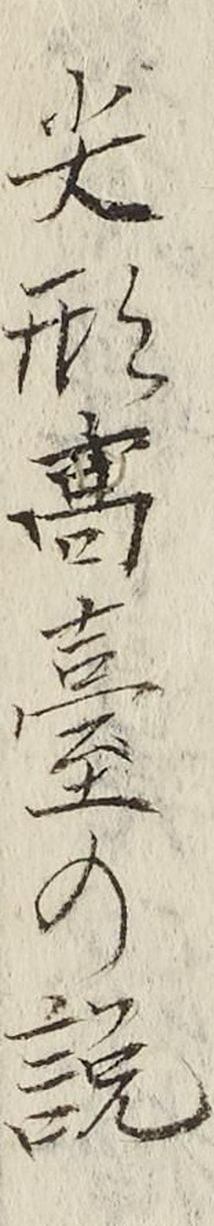尖形高台の説
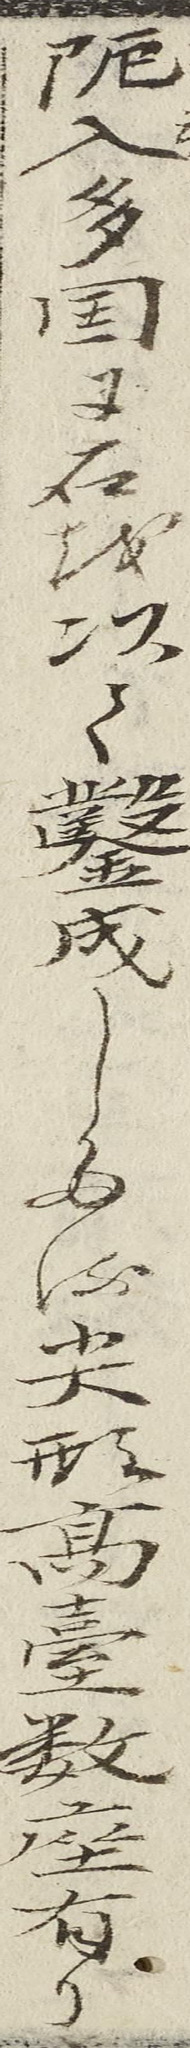阨入多国に石を以て鑿成したる尖形高台数座有り
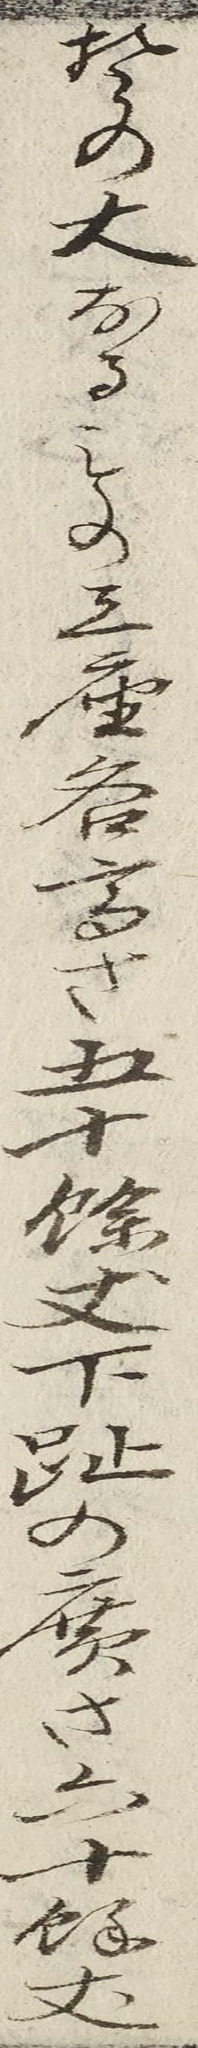その大なるもの三座各高さ五十余丈下趾の廣さ六十余丈
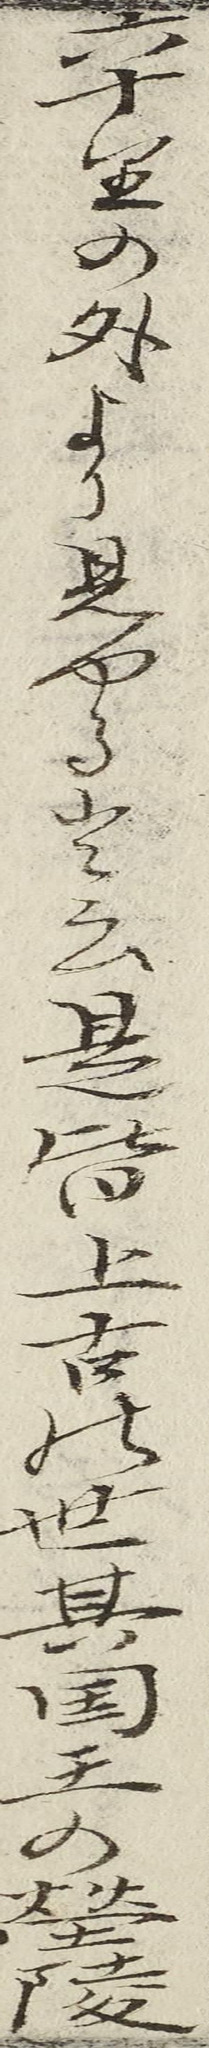六十里の外より見ゆると云且皆上古の世其国王の塋陵
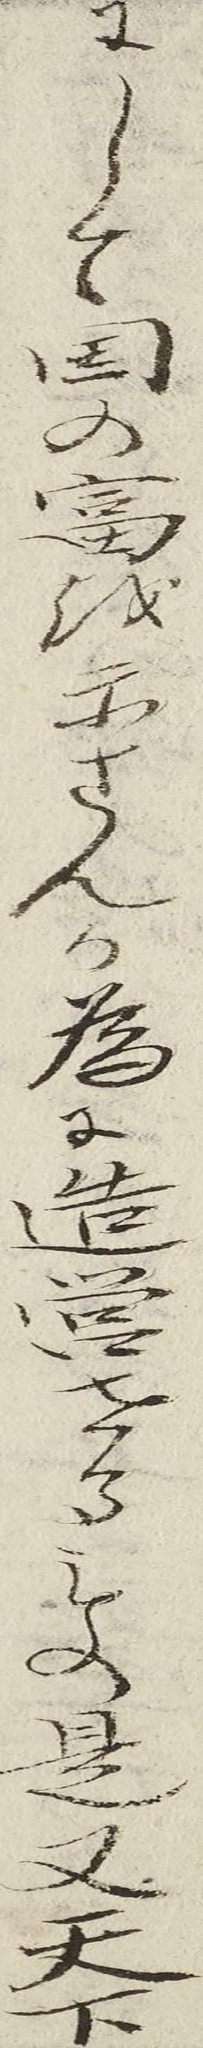にして国の富を示さんか為に造営せるもの是又天下
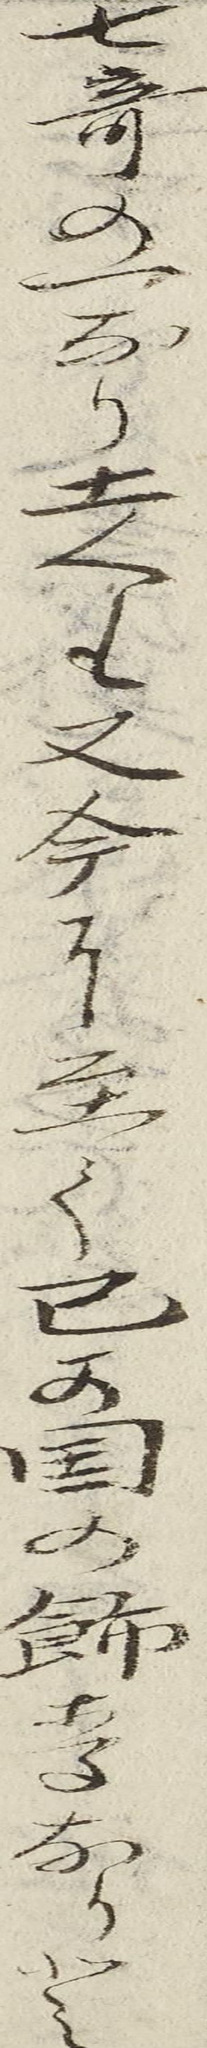七奇の一なり土人も今に至て己か国の飾りなりと
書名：西洋雜記　坤
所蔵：東京大学地震研究所図書室 Earthquake Research Institute Library, The University of Tokyo, JAPAN
